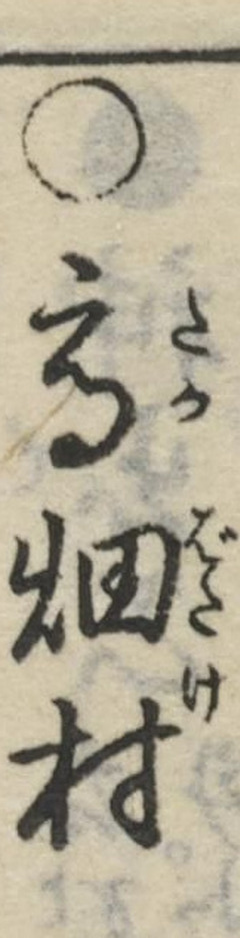○高畑村
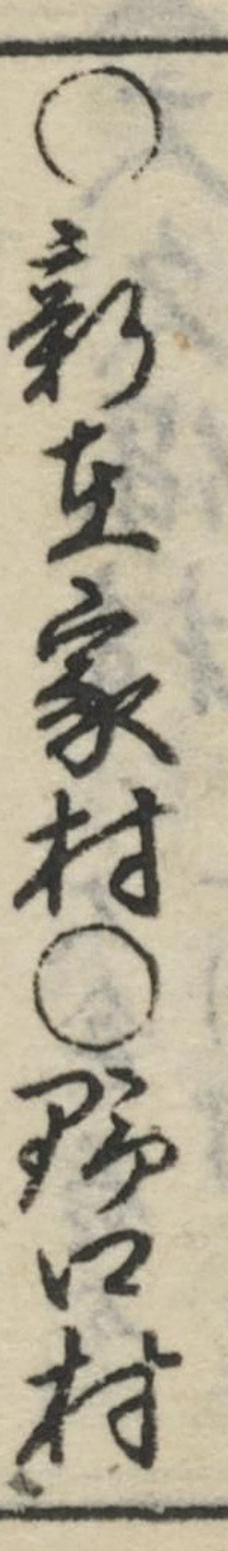○新在家村○野口村
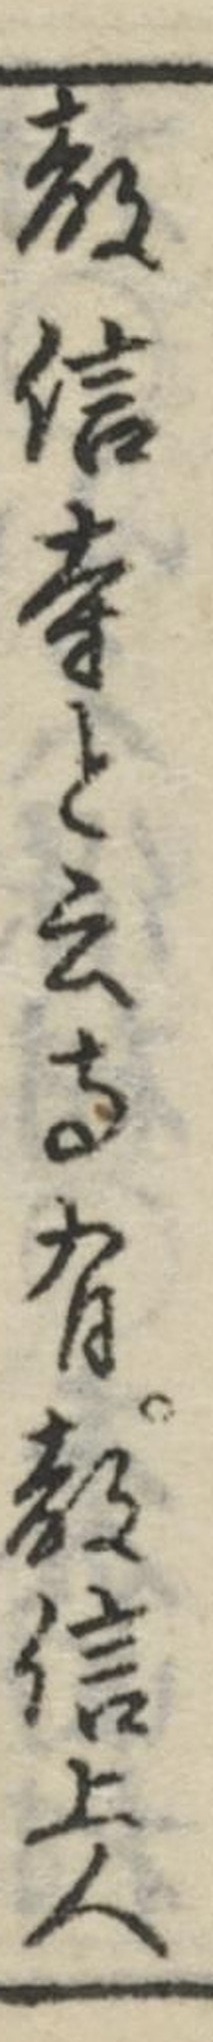教信寺と云寺有。教信上人
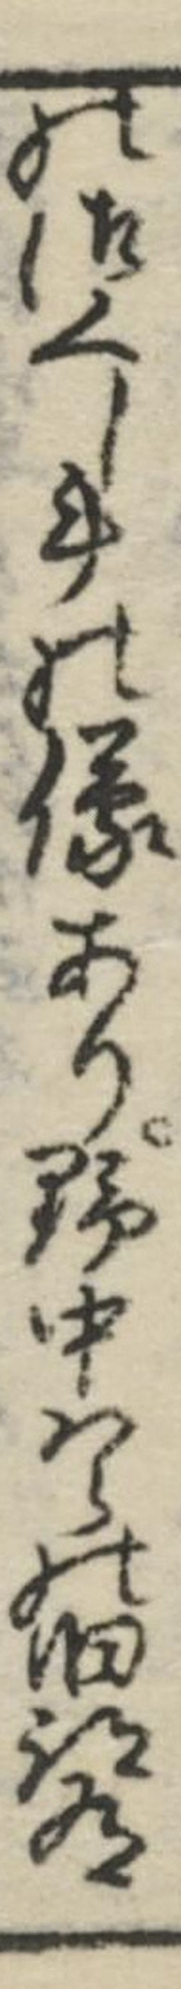の御くし斗の像あり。野中はらの旧跡有
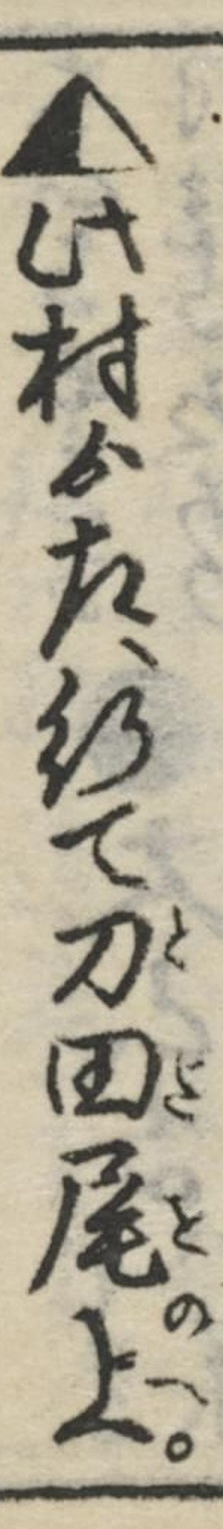▲此村ゟ左へ行て刀田尾上。
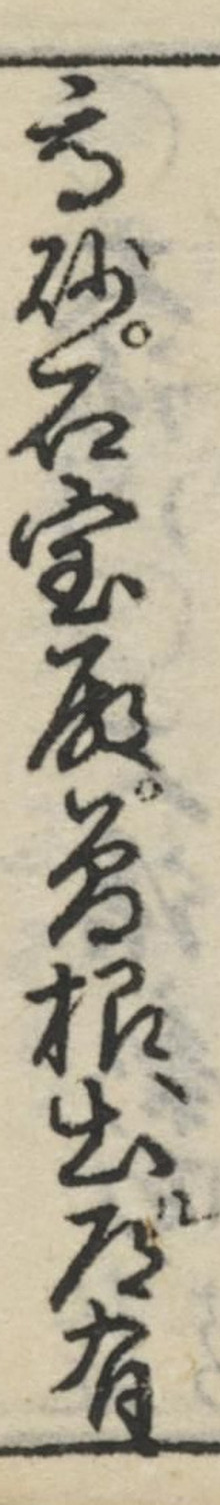高砂。石宝殿。曽根へ出る道有
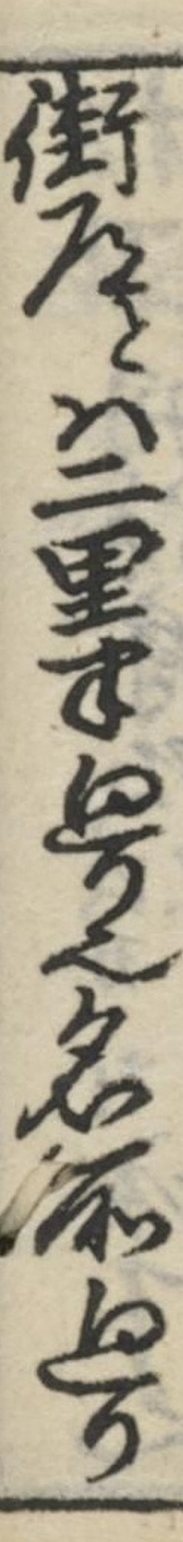街道とはニ里半廻り也名所廻り
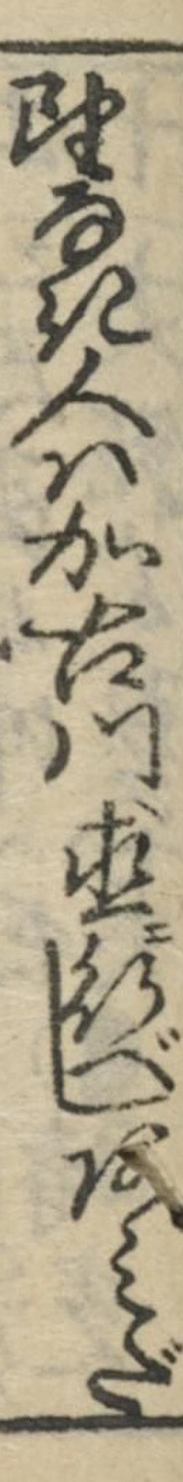届なき人は加古川へ直に行べしあみだ
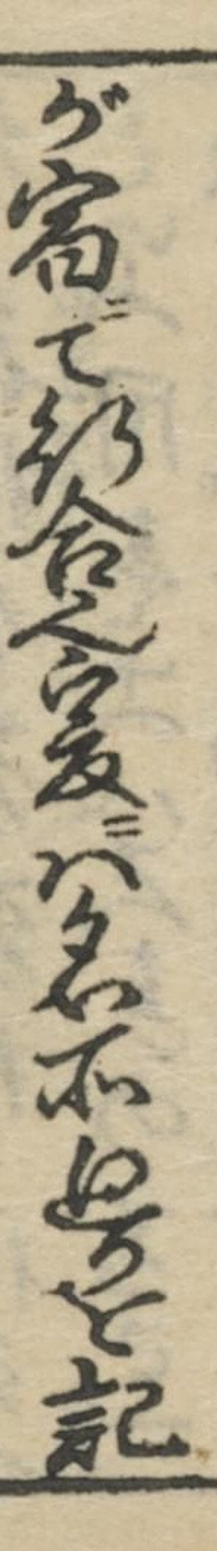が宿にて行合也爰には名所廻りを記
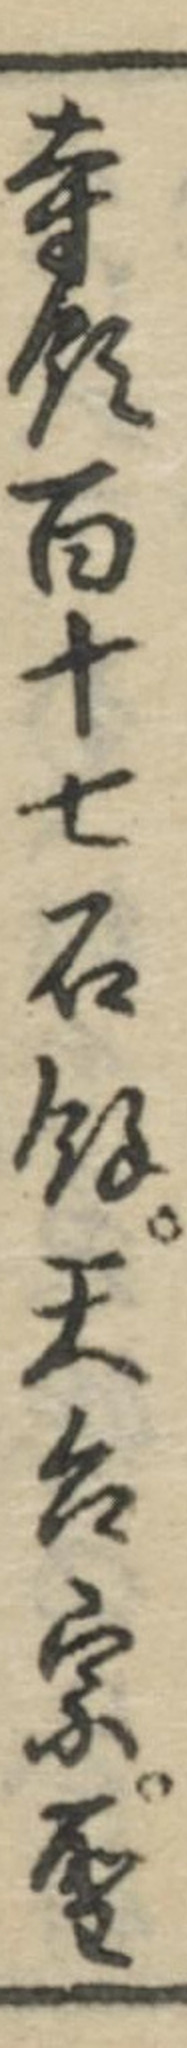寺領百十七石余。天台宗。聖
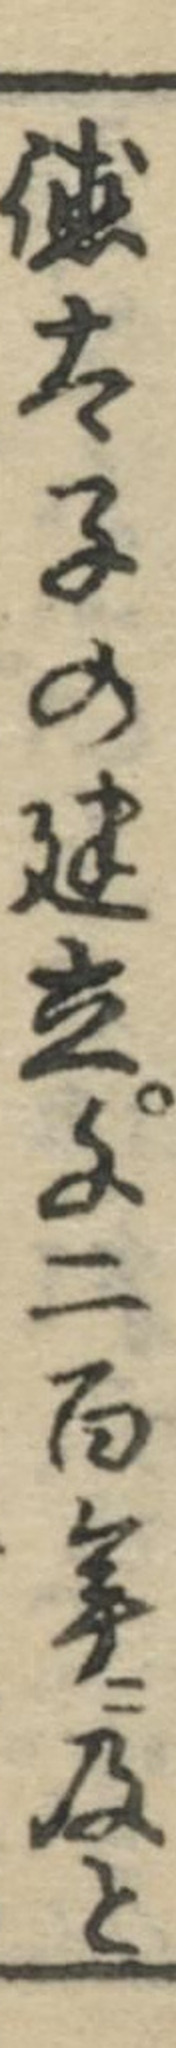徳太子の建立。千ニ百年に及と
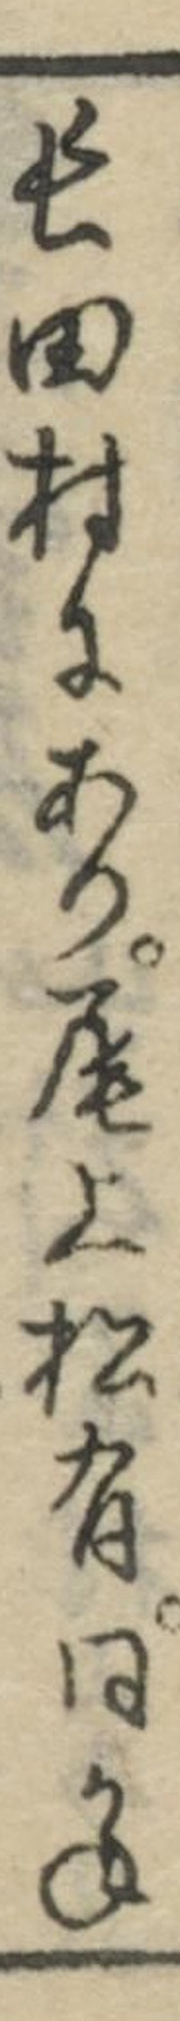長田村にあり。尾上松有。同かね
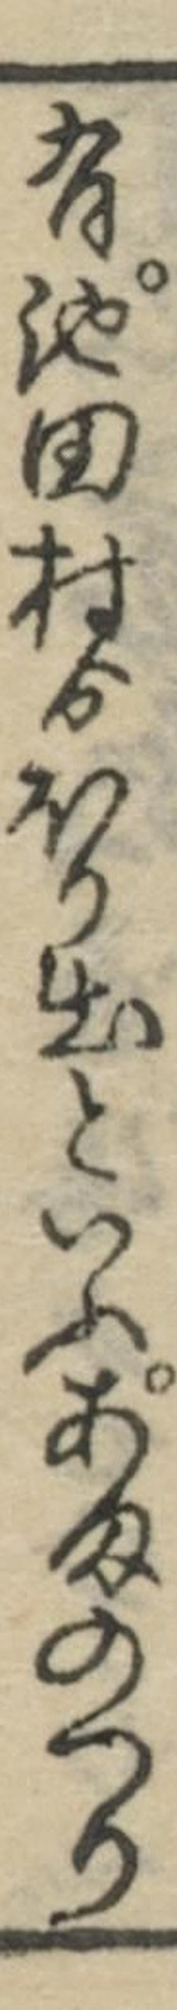有。池田村ゟほり出といふ。あまのつり
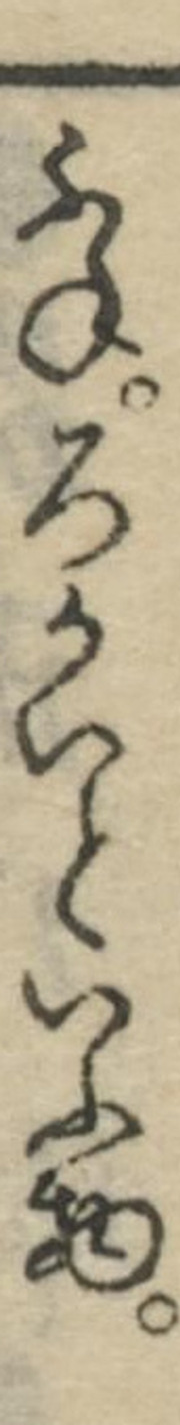ふね。ろかいといふ物。
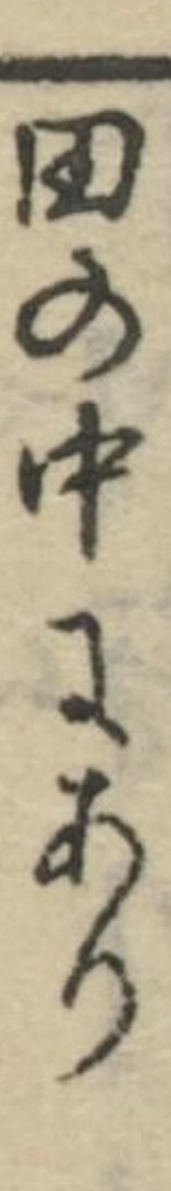田の中にあり
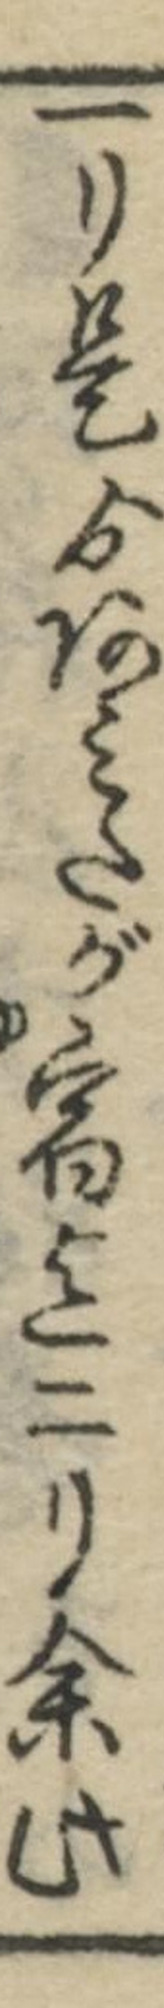一り是ゟあみたが宿迄ニり余此
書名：但州城崎浴湯辧
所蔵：東京大学地震研究所図書室 Earthquake Research Institute Library, The University of Tokyo, JAPAN
